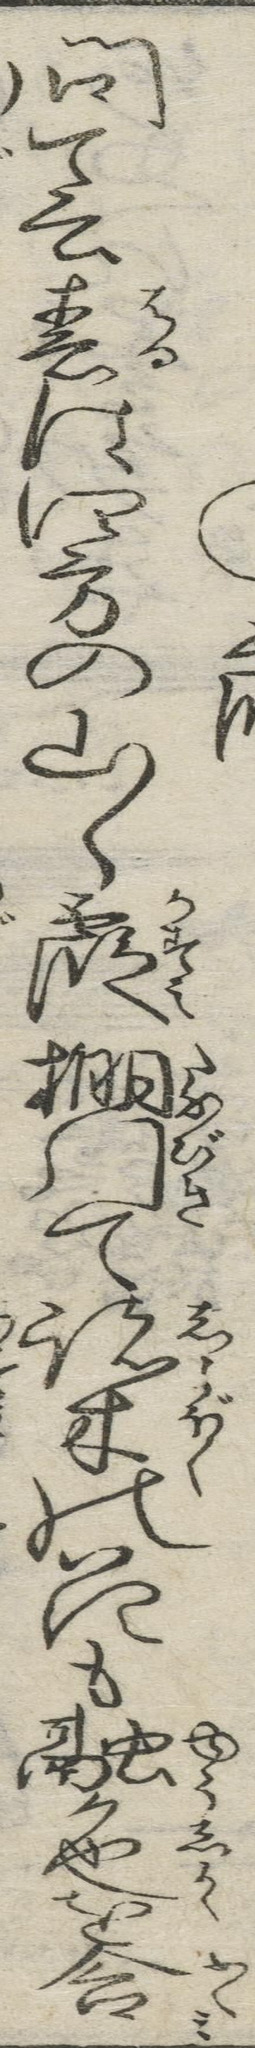問て云春は四方の山々霞棚引て諸木の花も融色を含ミ
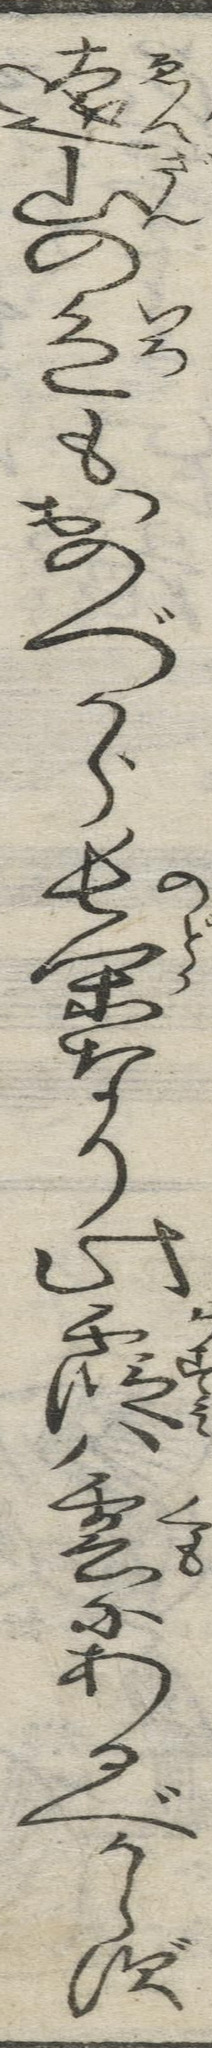遠山の色もおのづから長閑なり此霞ハ雲にあるべからず
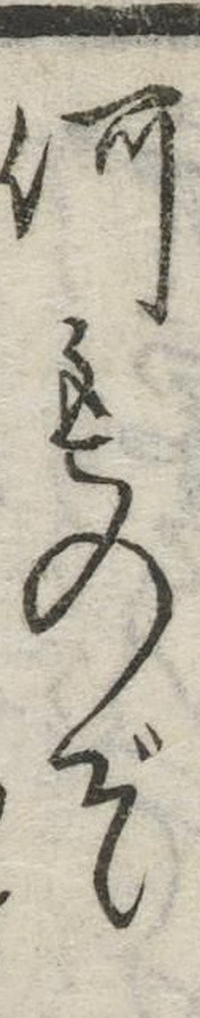何ものぞ
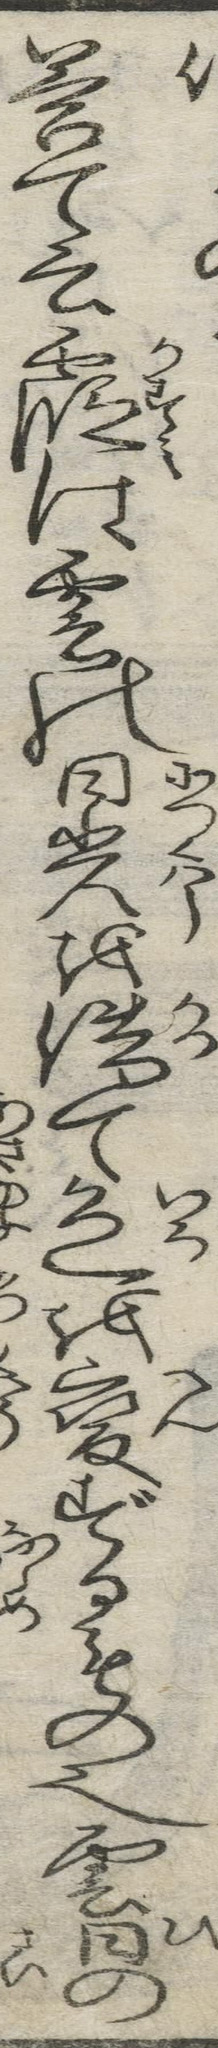答て云霞は雲の日光を借て色を変ずるもの也雲日の
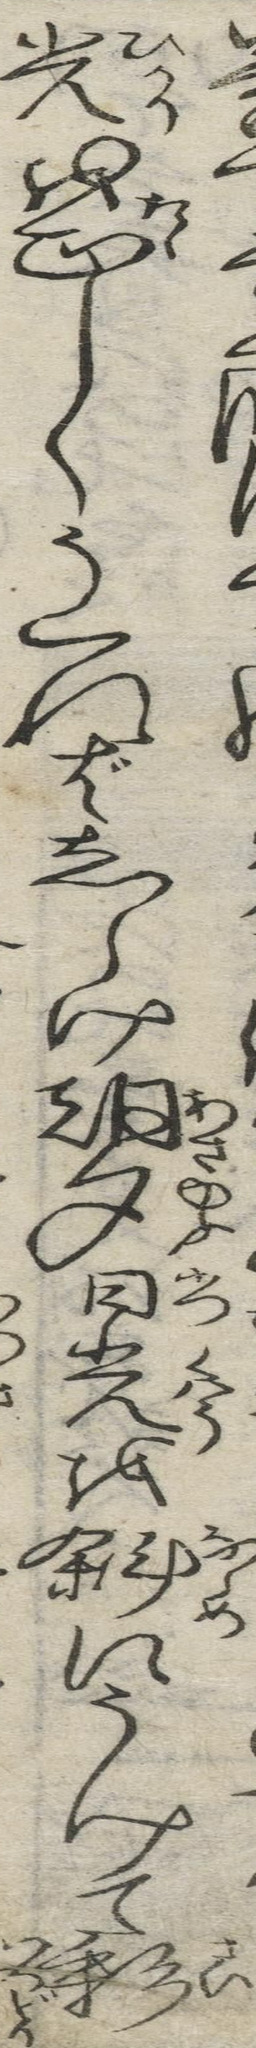光を正しくうつればしらけ朝夕日光を斜にうけて彩
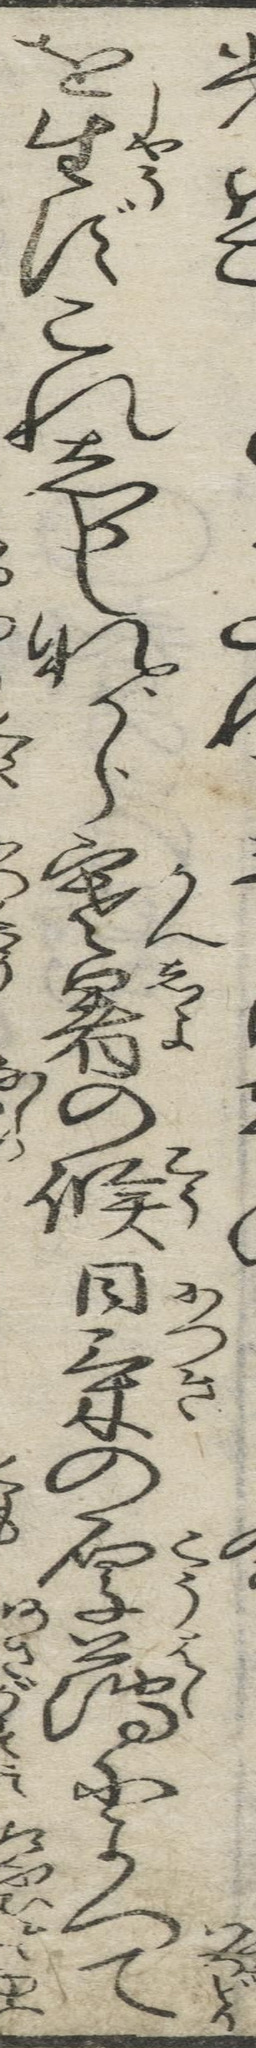を生ずこれしかしなから寒暑の候日気の厚薄によつて
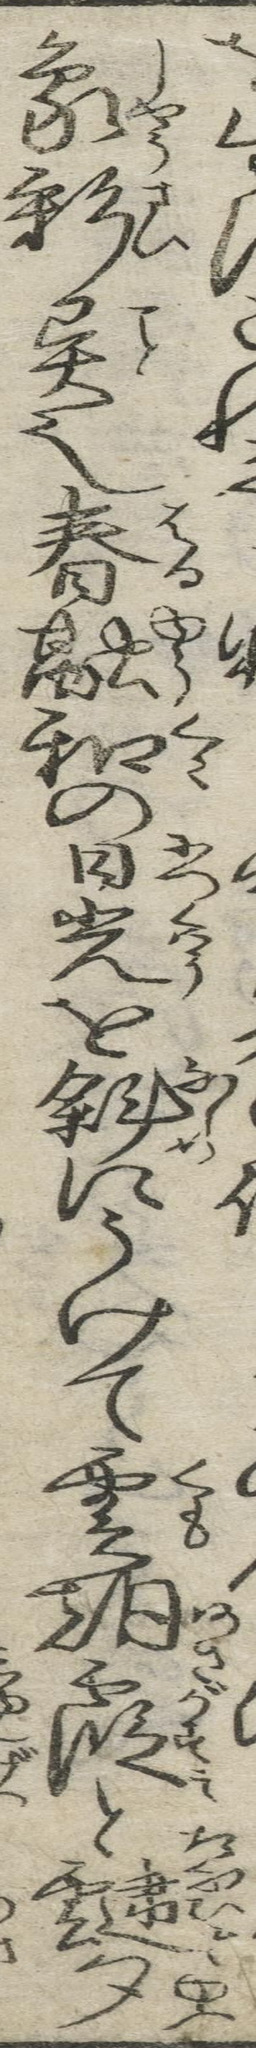象彩異也春融和の日光を斜にうけて雲朝霞と靆夕
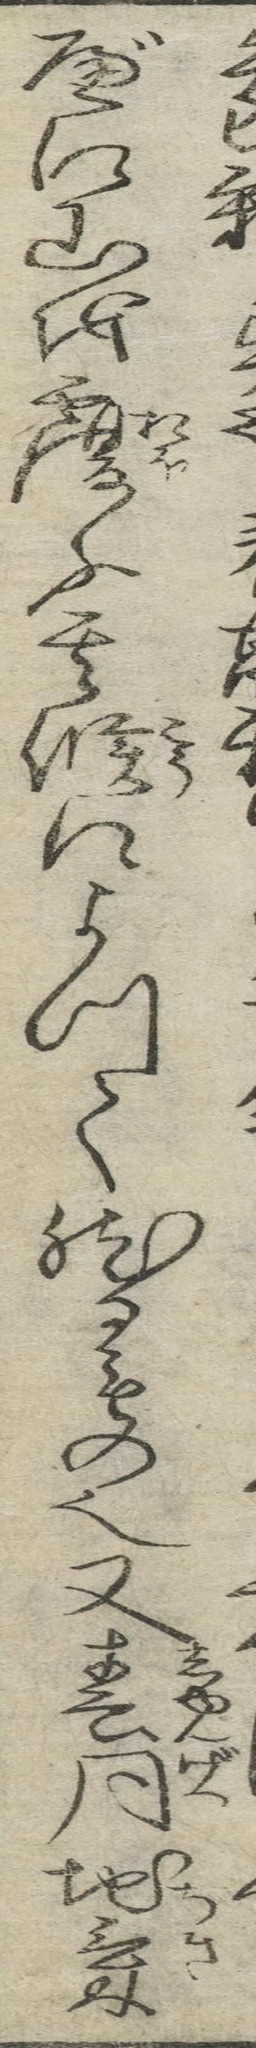べに山を覆ふ其候によつて然るもの也又春月地気

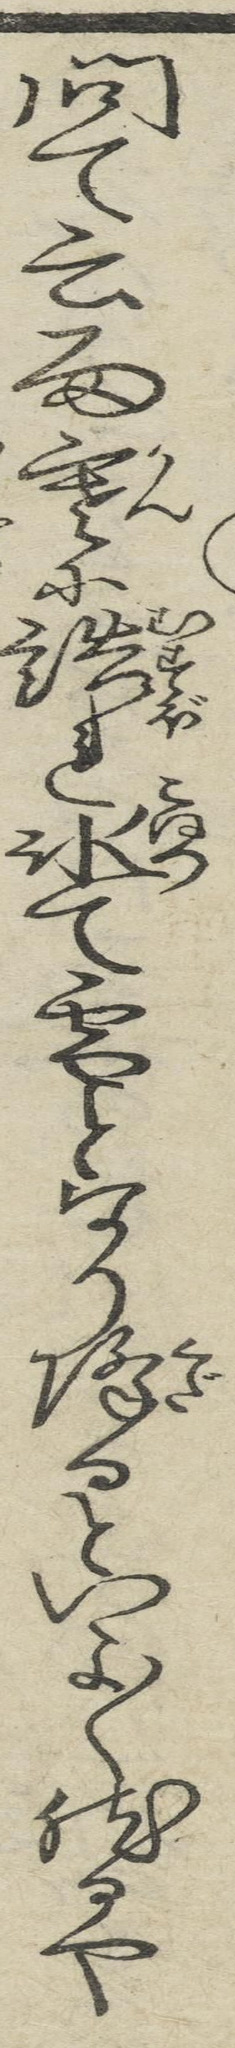問て云雨寒に結れ氷て雪となり降るといよ〳〵然るや
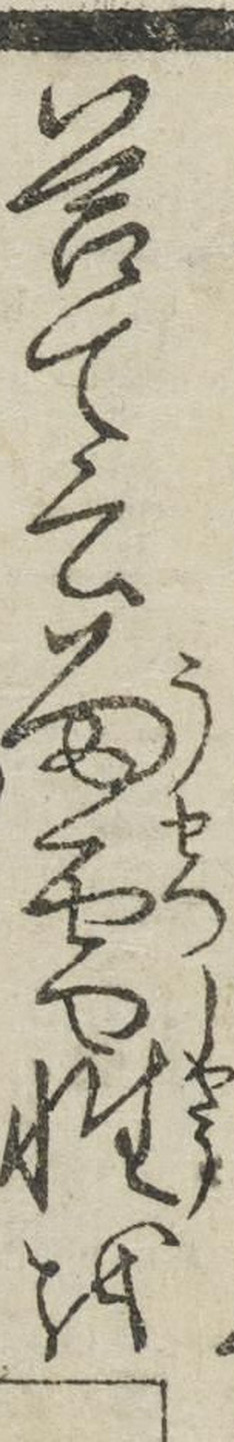答て云雨雪性を
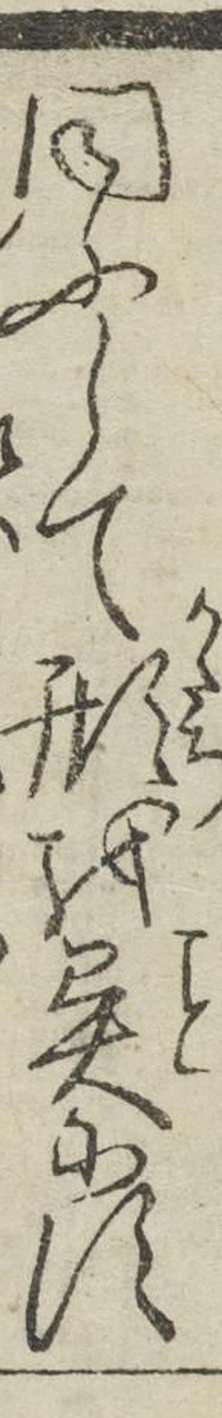同ふして形を異にす
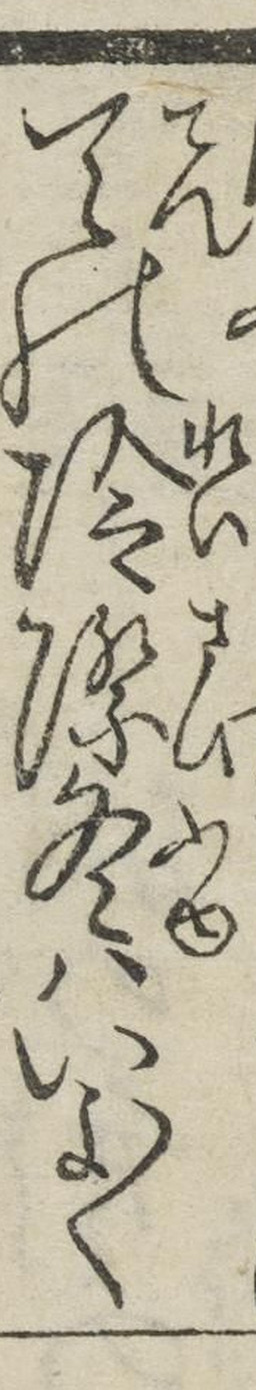天の冷際冬はいよ〳〵
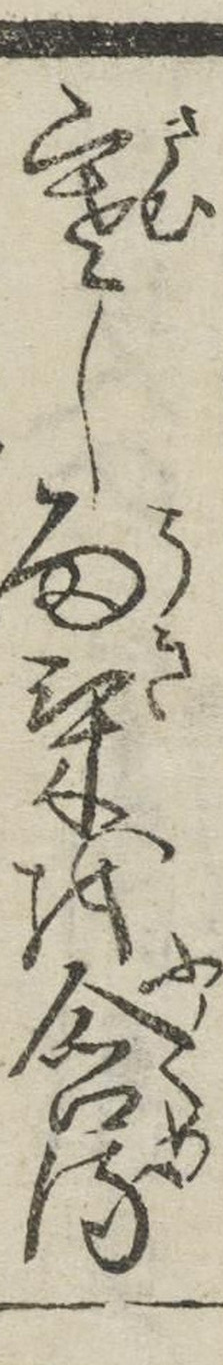寒し雨気を含る
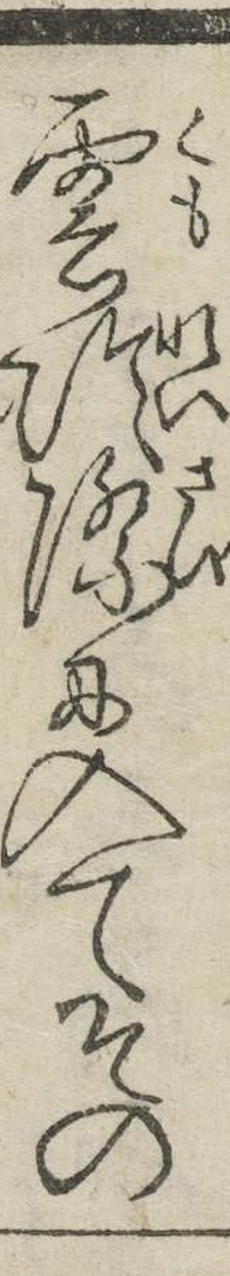雲冷際に入てその
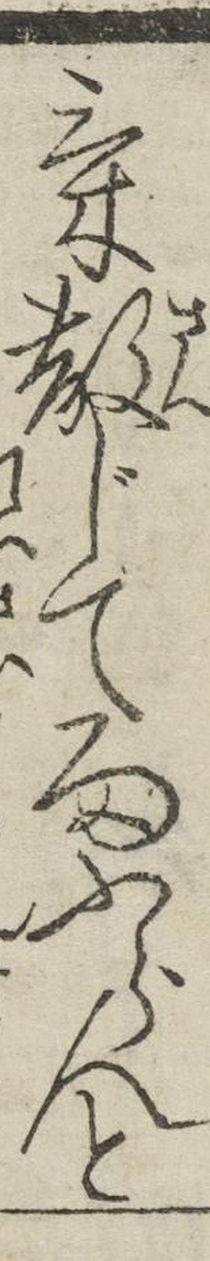気散じて雨ふらんと
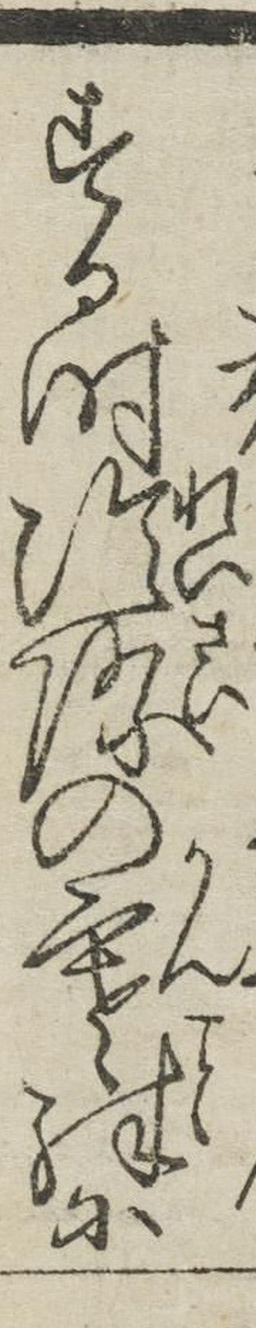する時冷際の寒殊に
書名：訓蒙天地辨　地
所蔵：東京大学地震研究所図書室 Earthquake Research Institute Library, The University of Tokyo, JAPAN
